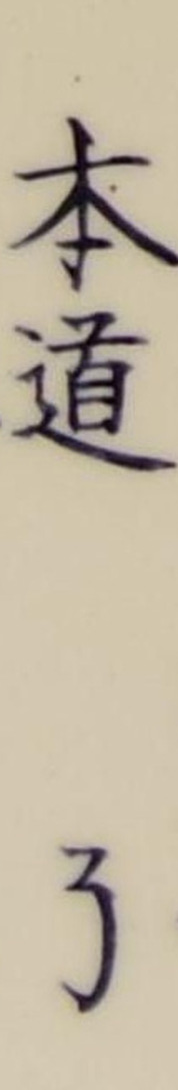本道了
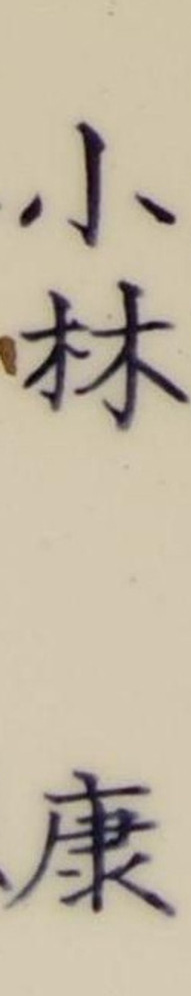小林康
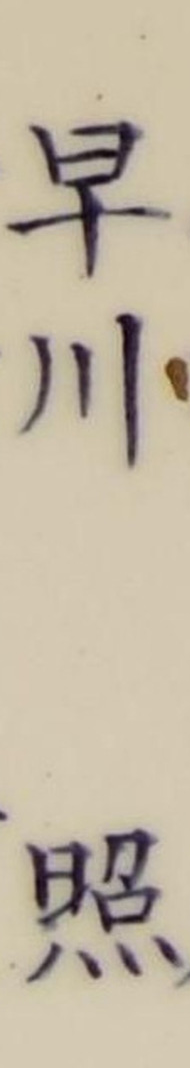早川照
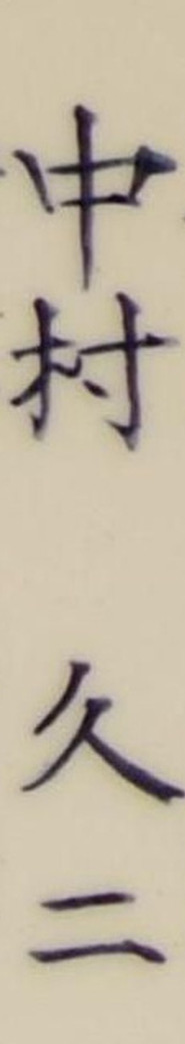中村久二
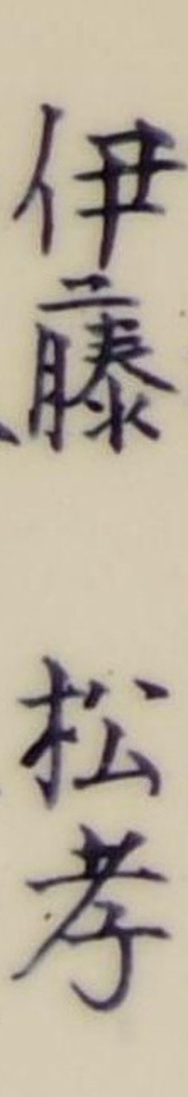伊藤松孝
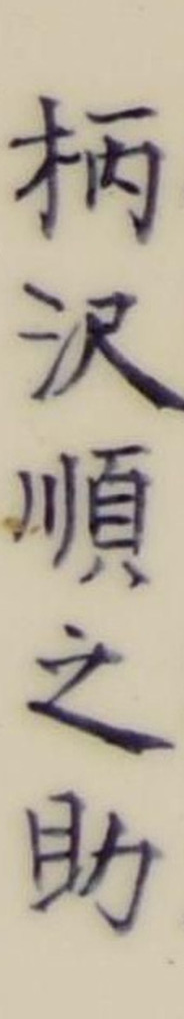柄沢順之助
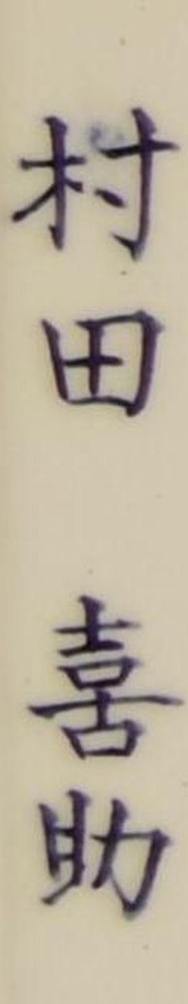村田喜助

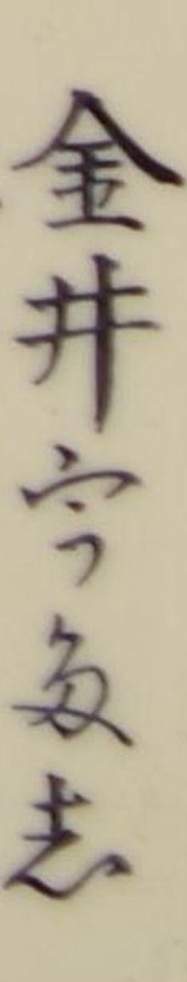金井うたし
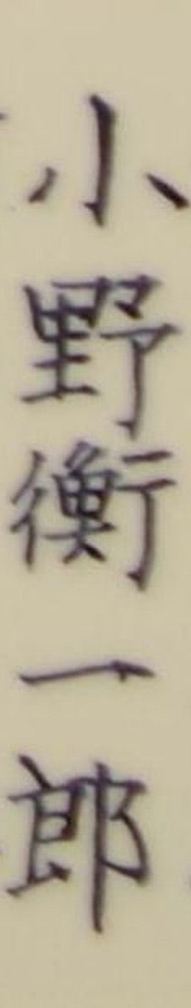小野衡一郎
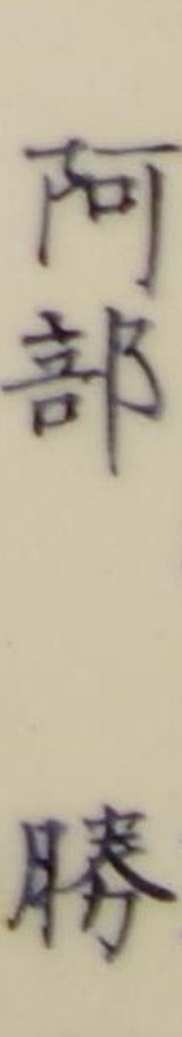阿部勝
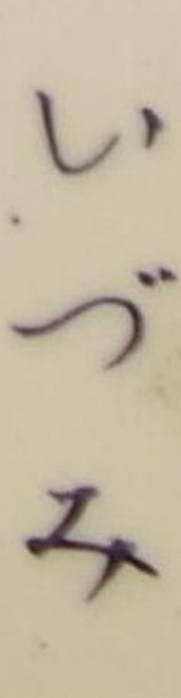いづみ
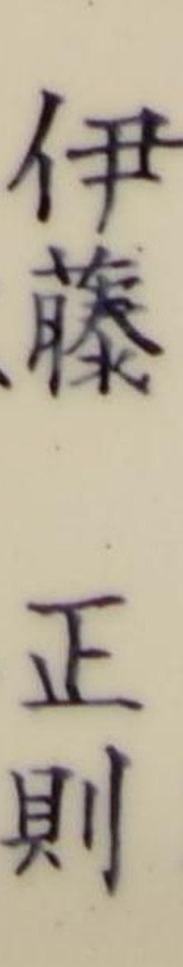伊藤正則
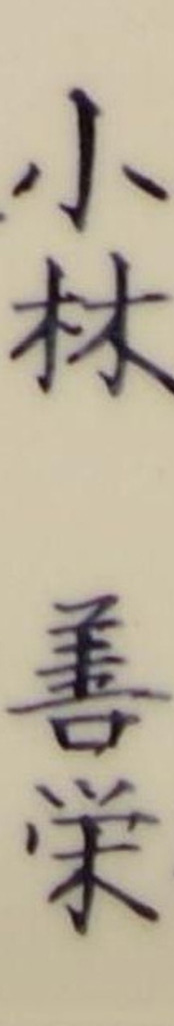小林善栄
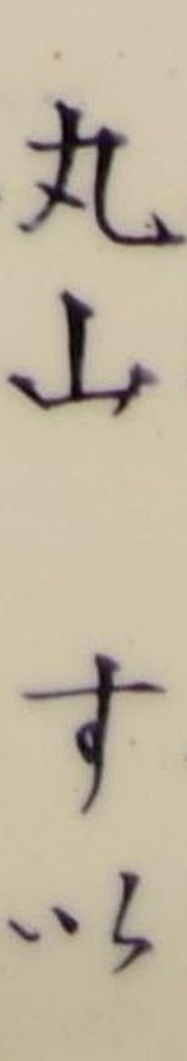丸山すい
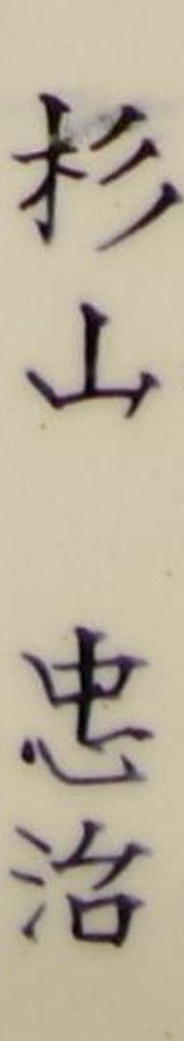杉山忠治
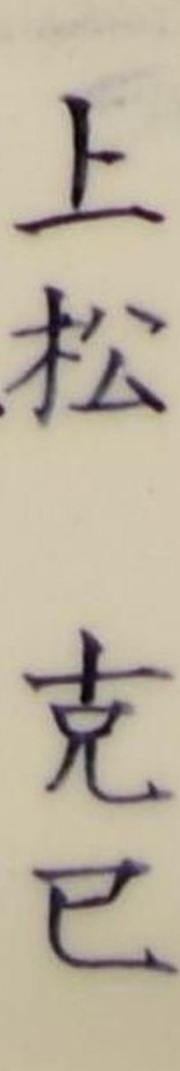上松克巳
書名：A~D
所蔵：koyasan kongobuji
